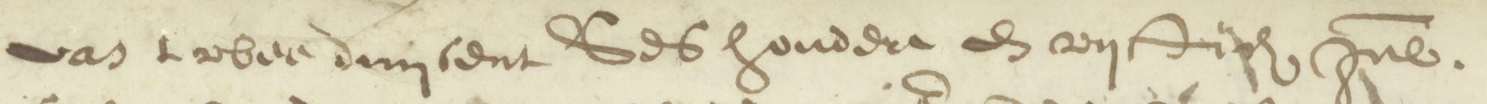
van twee duysent Ses hondert en vyftich gul.
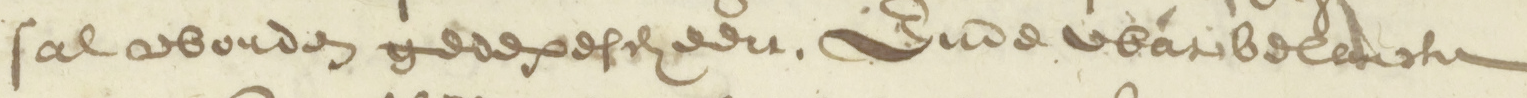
sal worden gedepescheert. Ende wat belancte
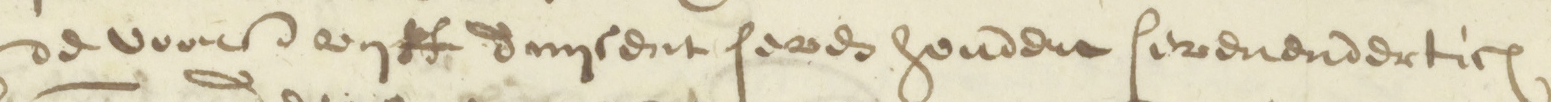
de voors vyff duysent seven hondert sevenendertich
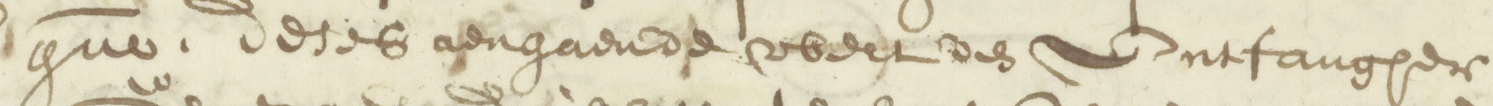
gul. deses aengaende wert den Ontfangher
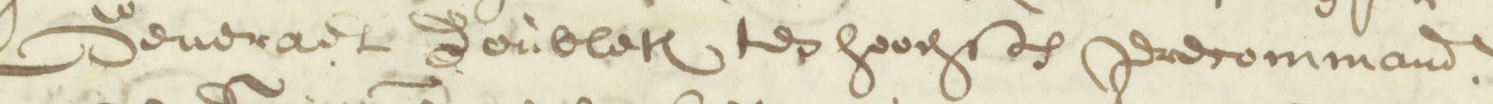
Generael Doubleth ten hoochsten gerecommandt.
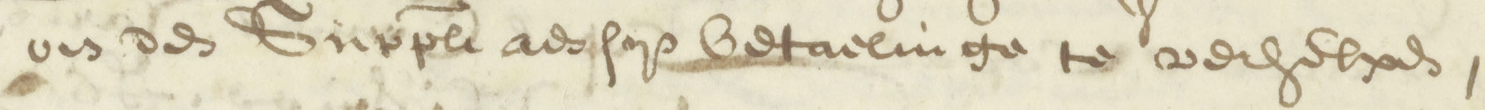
om den Supplt aen syn betaelinge te verhelpen.
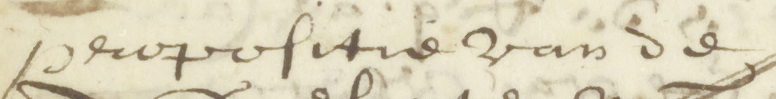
propositie van de
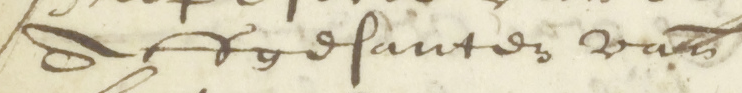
Affgesanten van
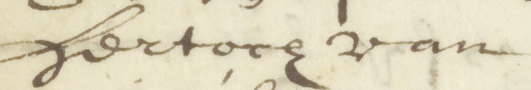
Hertoch van
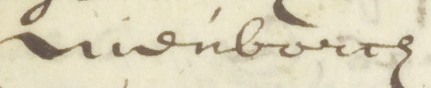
Nieuborch
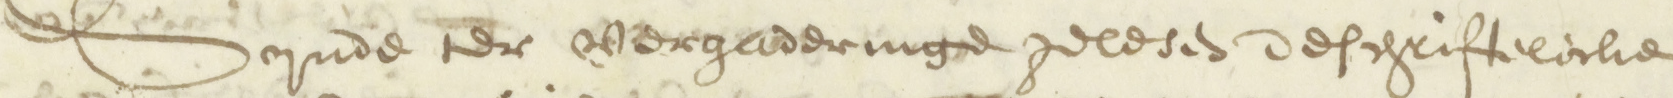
Synde ter Vergaderinge gelesen de schriftelicke
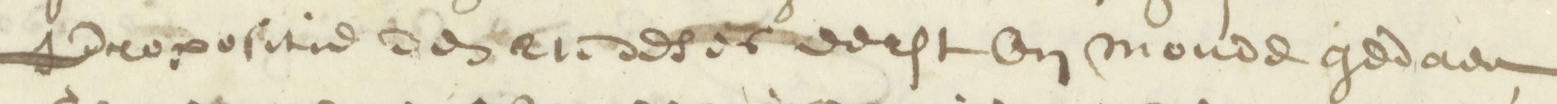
Propositie den 21. deses eerst by monde gedaen
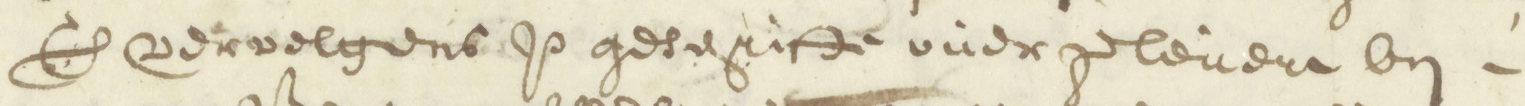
& vervolgens op geschrifte ouergelevert by
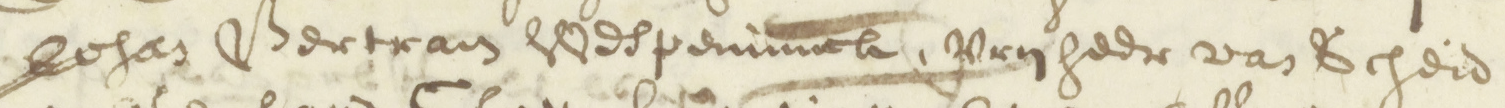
Johan Bertram Wespenninck, Vrijheer van Scheid
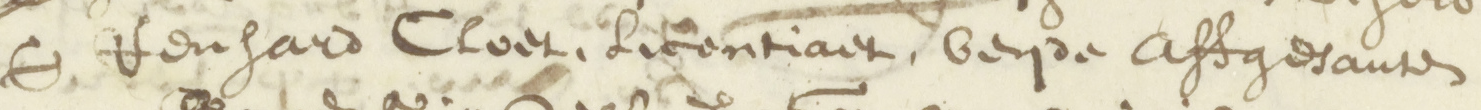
& Renhard Cloet, Licentiaet, beyde Affgesanten
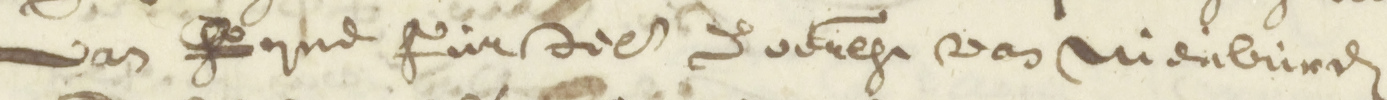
van Syne Furstel Doorlht van Nieuburch
